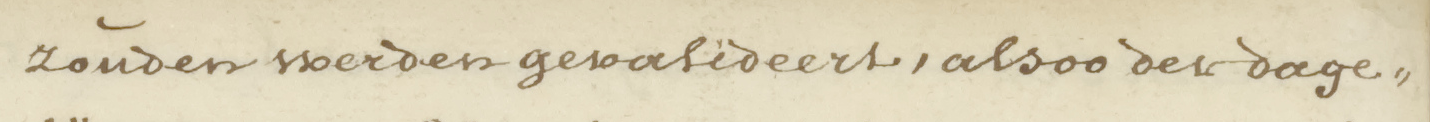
zouden werden gevalideert, alsoo der dage„
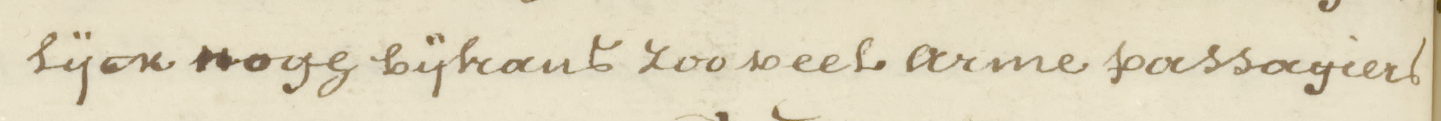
lijcx nogh bijkans zoo veel arme passagiers
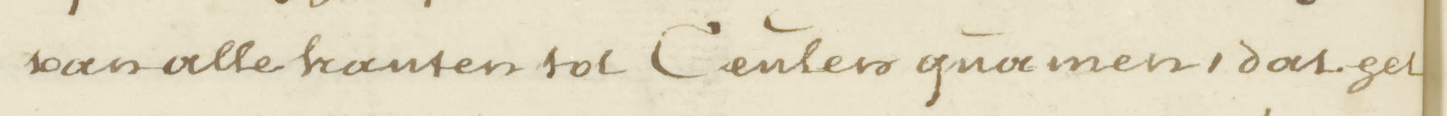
van alle kanten tot Ceulen quamen, dat het
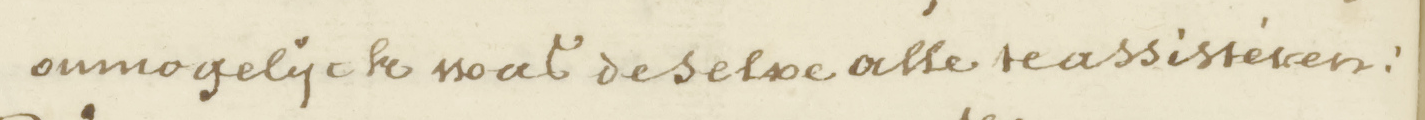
onmogelijck was deselve alle te assisteren:
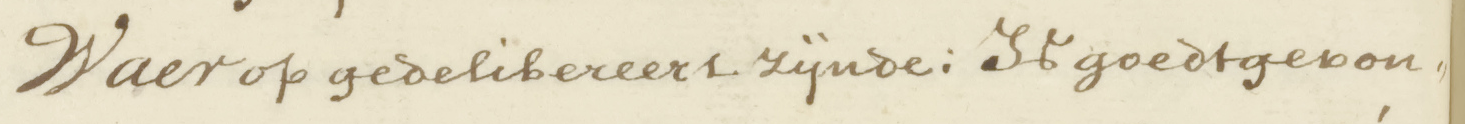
Waer op gedelibereert zijnde: Is goedtgevon„
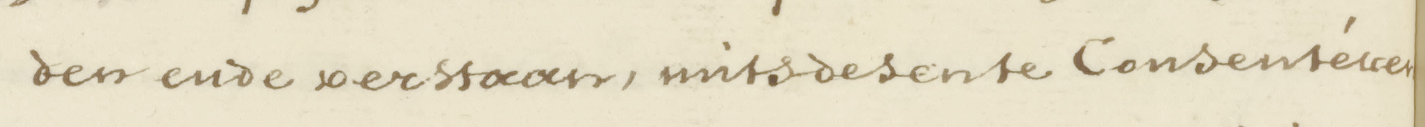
den ende verstaan, mits desen te Consenteren
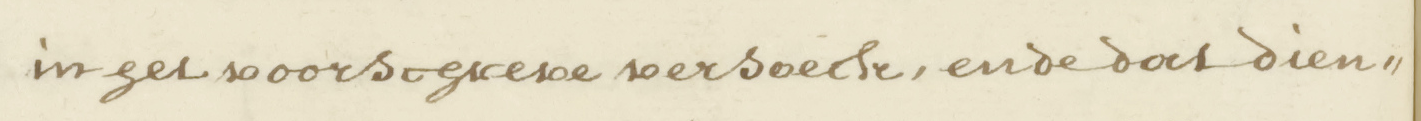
in het voorschreve versoeck, ende dat dien„
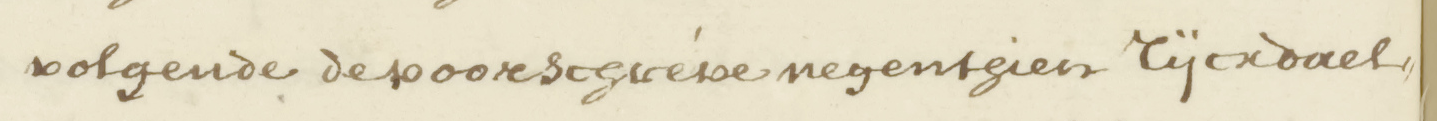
volgende de voorschreve negenthien rijcxdael
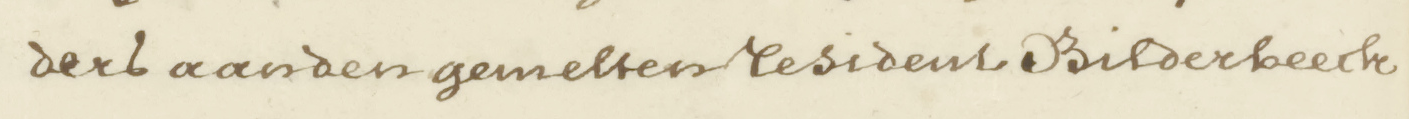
ders aanden gemelten resident Bilderbeeck
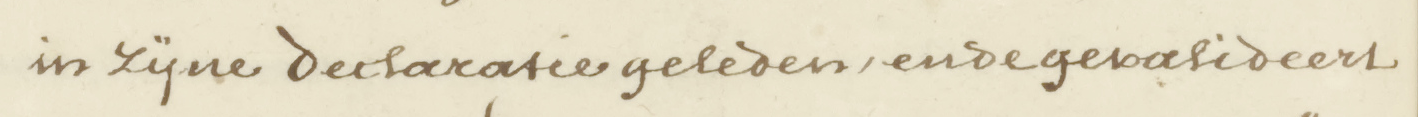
in zijne declaratie geleden, ende gevalideert
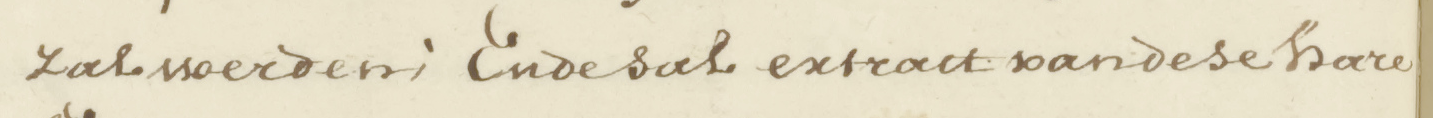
zal werden; Ende sal extract van dese hare
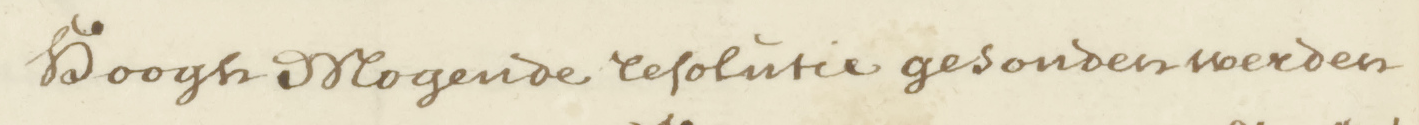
Hoogh Mogende resolutie gesonden werden
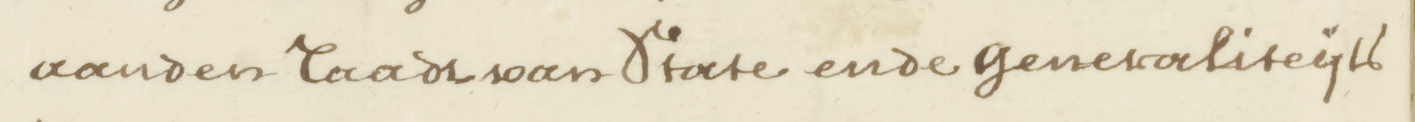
aanden Raadt van State ende generaliteijts
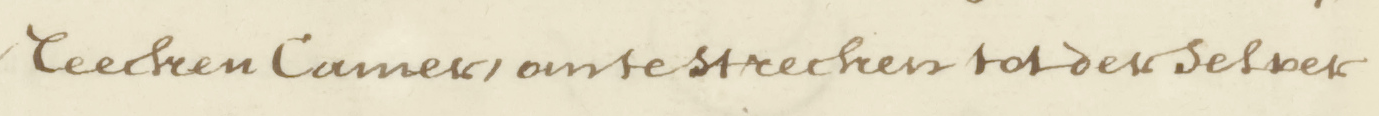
Reecken Camer, om te strecken tot derselver
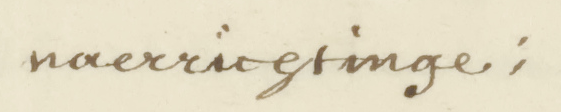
naerrichtinge:
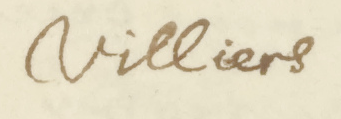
Villiers
